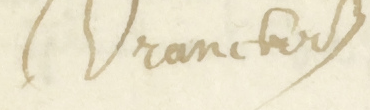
Vranckr
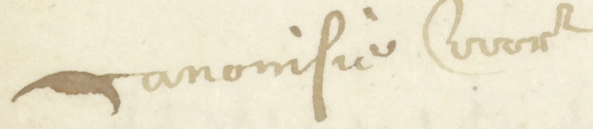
Canonisie voor
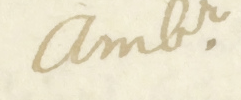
Ambr.
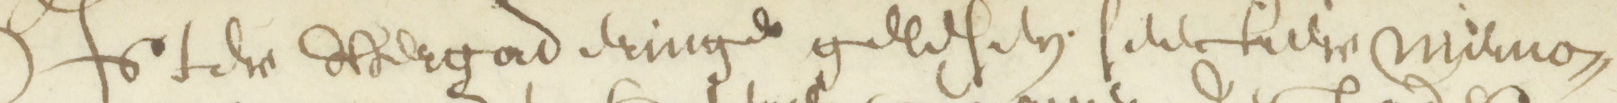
Is ter Vergaderinge gelesen seecker Memo„
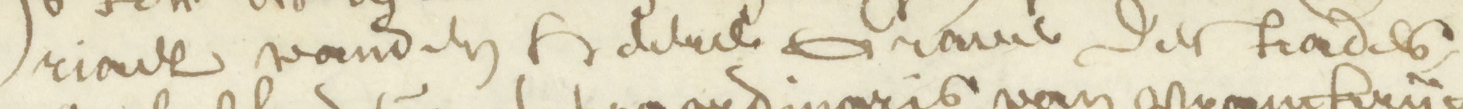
riael vanden Heere Grave Destrades,
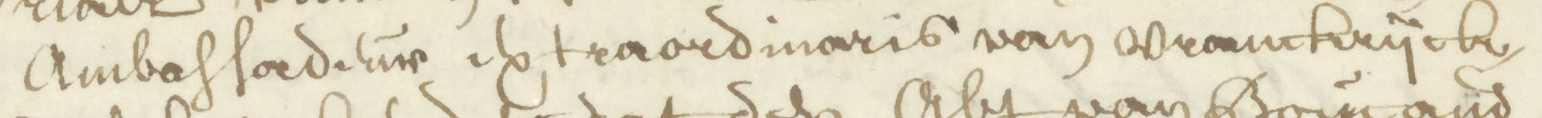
Ambassadeur extraordinaris van Vranckrijck,
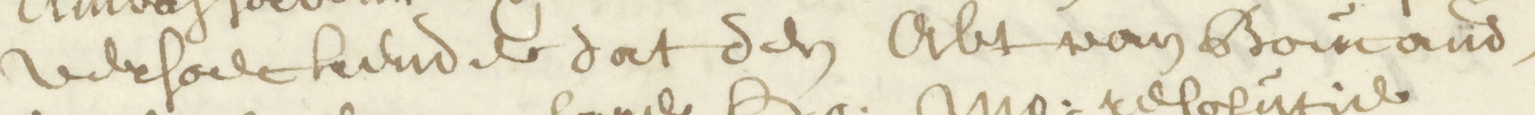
versoeckende dat den Abt van Boucand,
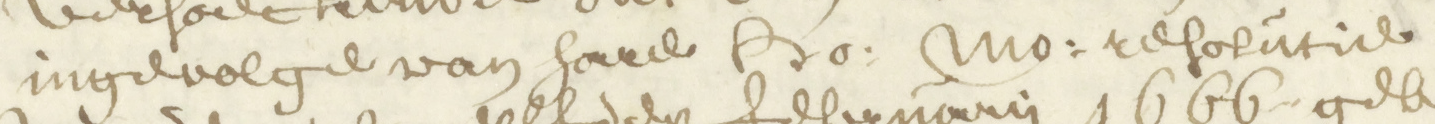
ingevolge van hare Ho:Mo: resolutie
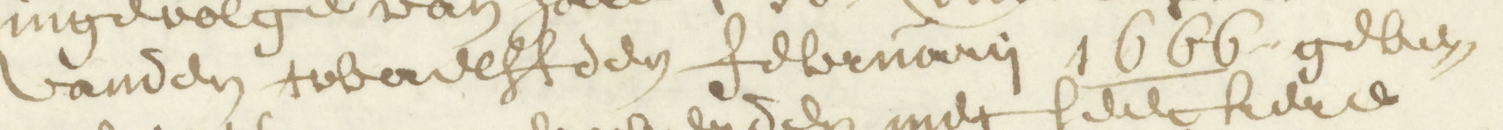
vanden twaelffden februarij 1666 gebe„
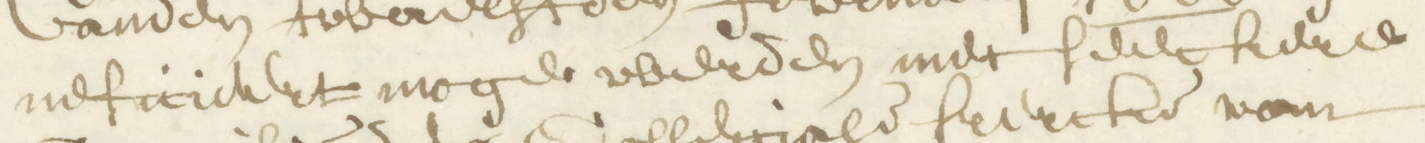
neficieert moge werden met seeckere
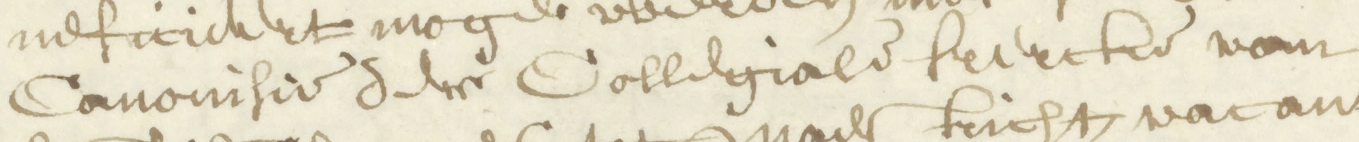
Canonisie der Collegiale Kercke van
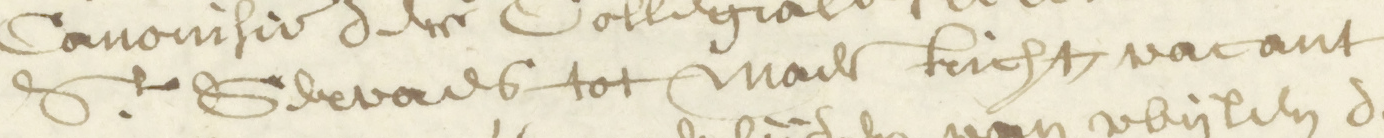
St. Servaes tot Maestricht, vacant
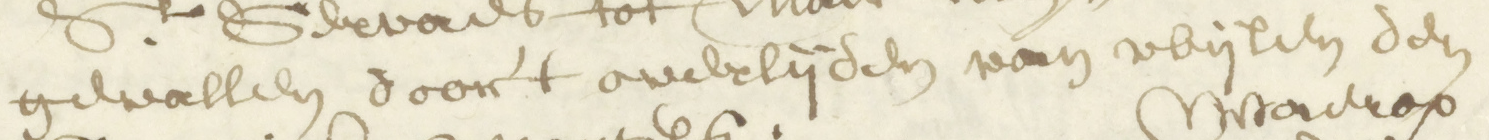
gevallen door 't overlijden van wijlen den
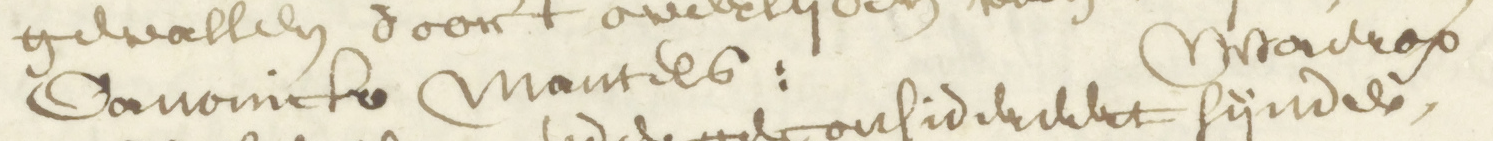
Canonick Mantels: Waerop
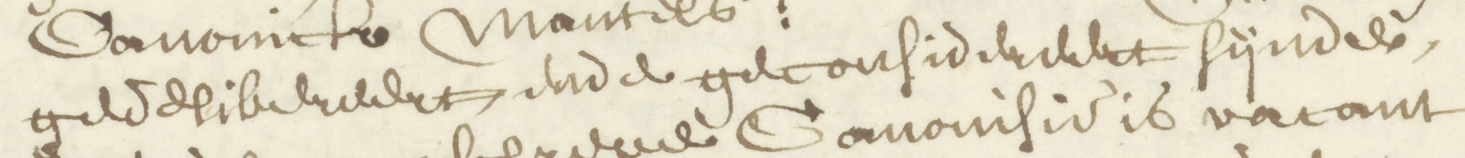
gedelibereert ende geconsidereert sijnde,
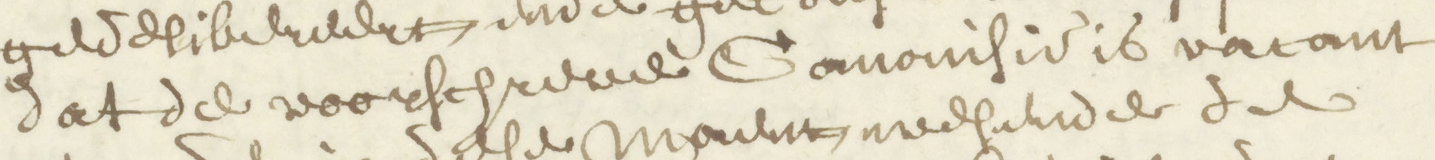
dat de voorschreve Canonisie is vacant
